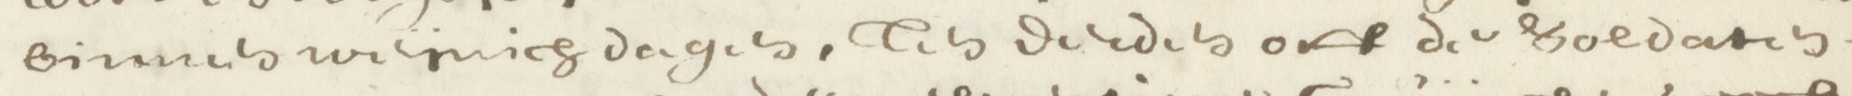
binnen weijnich dagen. Ten derden off de soldaten
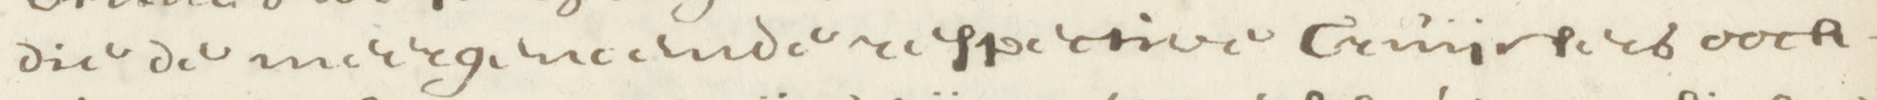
die de meergenoemde respective cruijssers oock
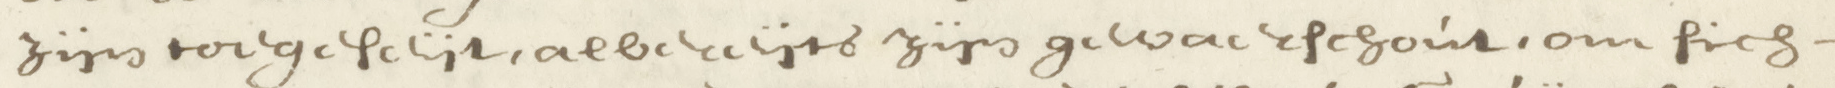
zijn toegeseijt, albereijts zijn gewaerschout om sich
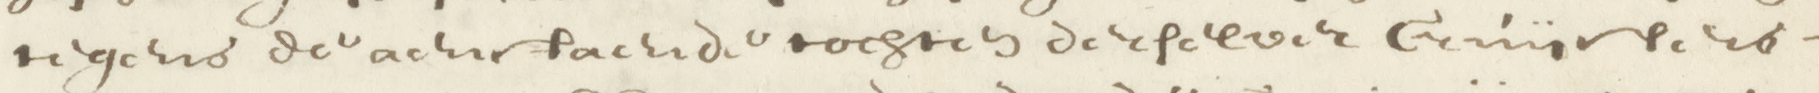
tegens de aenstaende tochten derselver cruijssers
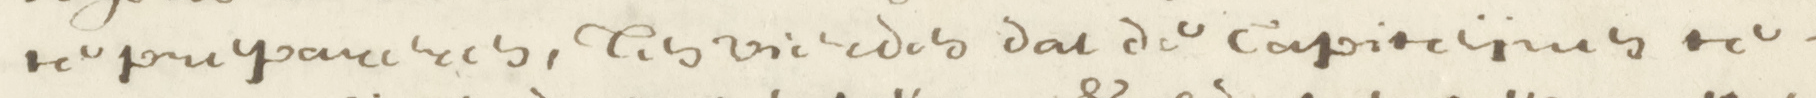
te prepareren. Ten vierden dat de capiteijnen te
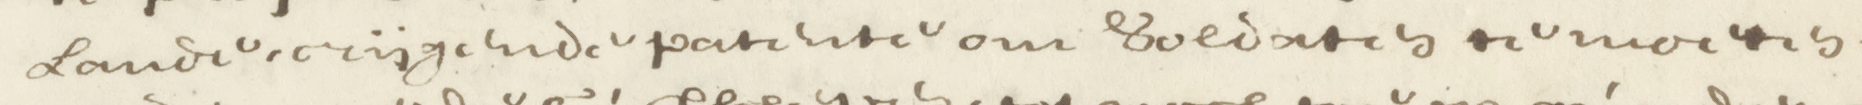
lande, crijgende patente om Soldaten te moeten
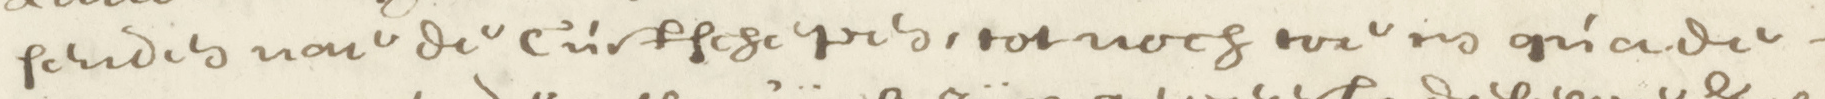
senden nae de custschepen, tot noch toe in quade
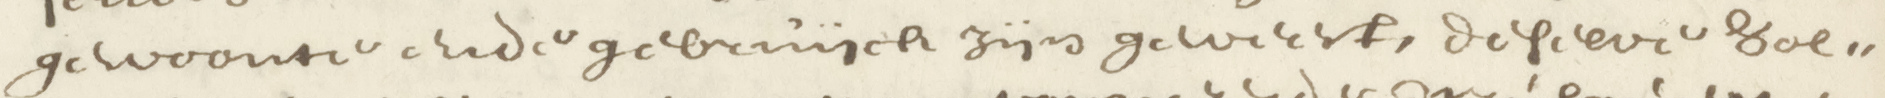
gewoonte ende gebruijck zijn geweest, deselve Sol„
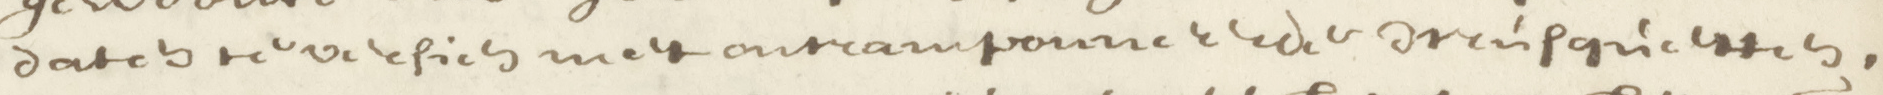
daten te versien met ontramponneerde musquetten,
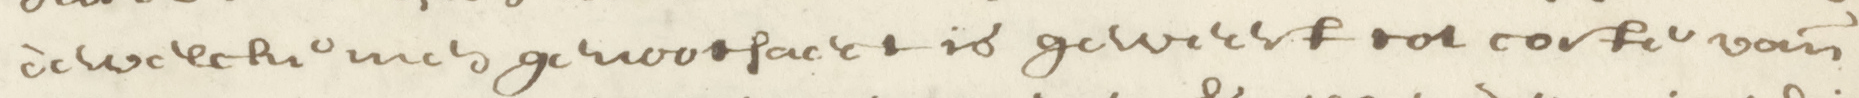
dewelcke men genootsaect is geweest tot coste van
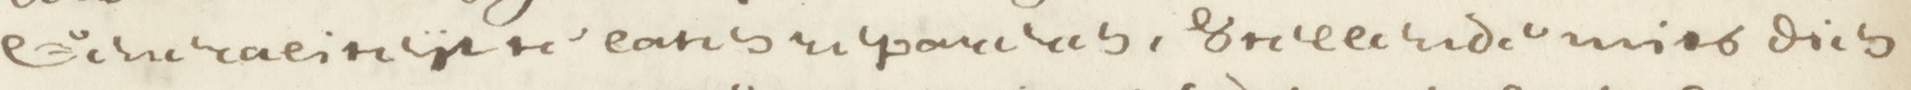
Generaliteijt te laten repareren, Stellende mits dien
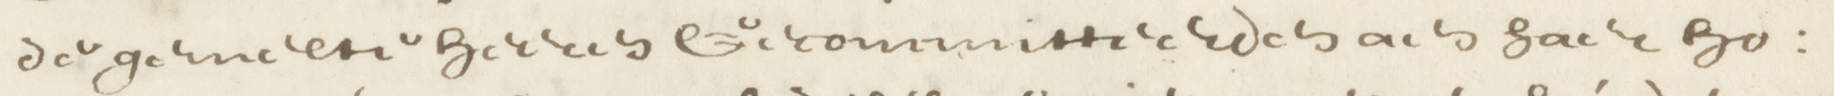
de gemelte heeren Gecommitteerden aen haer Ho:
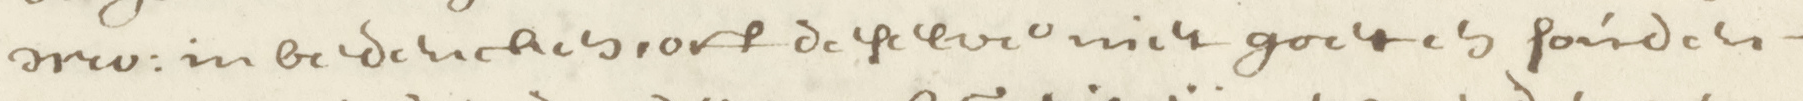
Mo: in bedencken, off deselve niet goet en souden
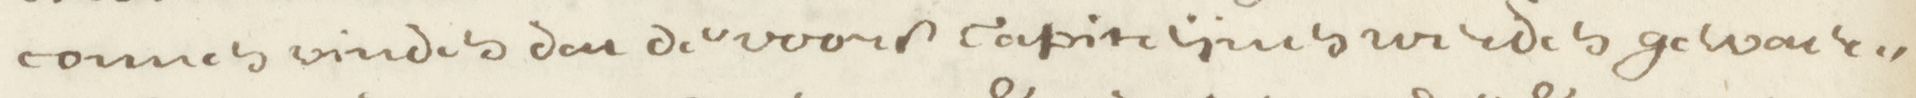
connen vinden dan de voors. capiteijnen werden gewaer„
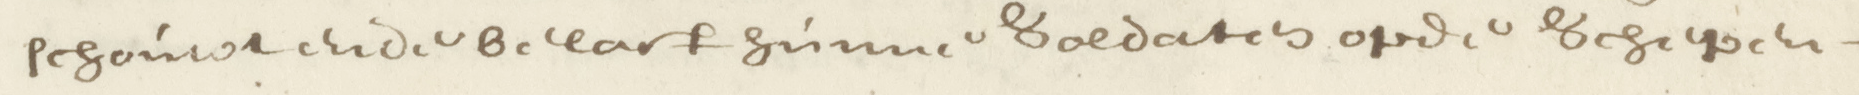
schouwt ende belast hunne Soldaten opde schepen
